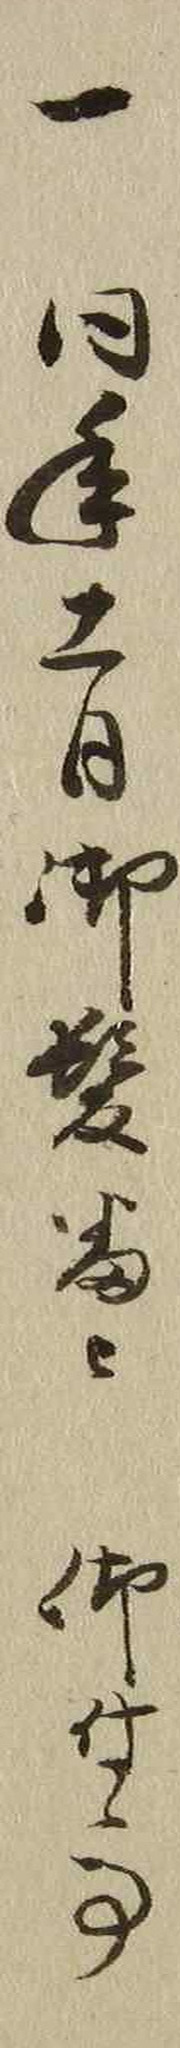一同年十一月御髪番被仰付候事
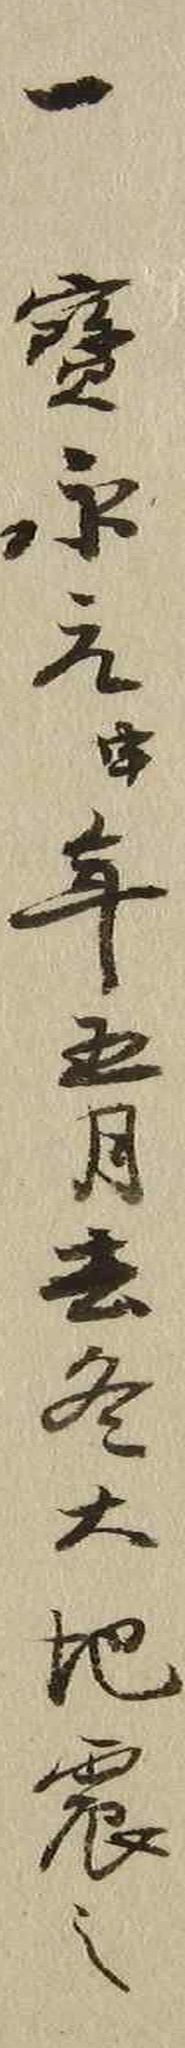一宝永元申年五月去冬大地震之
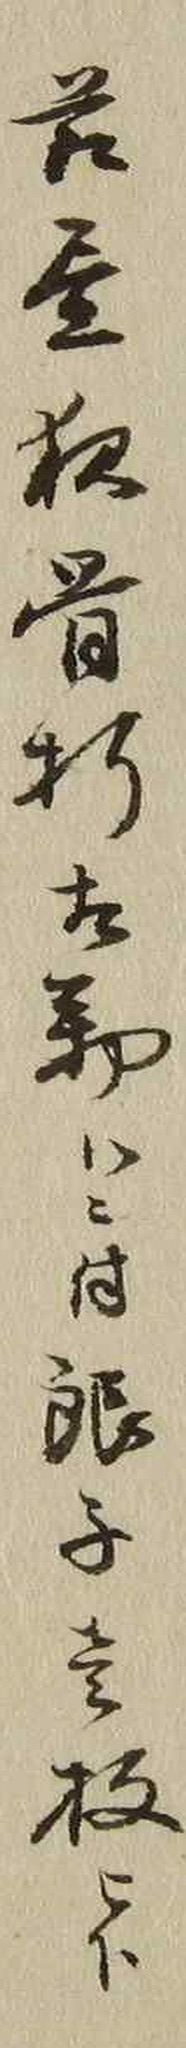節昼夜骨折相勤候ニ付銀子壱枚被下
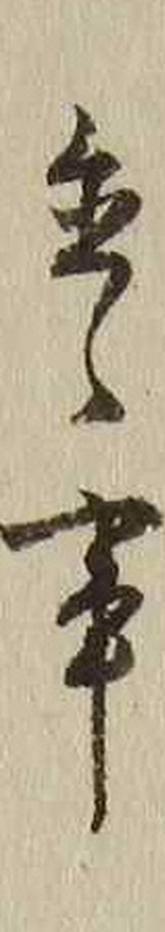置候事
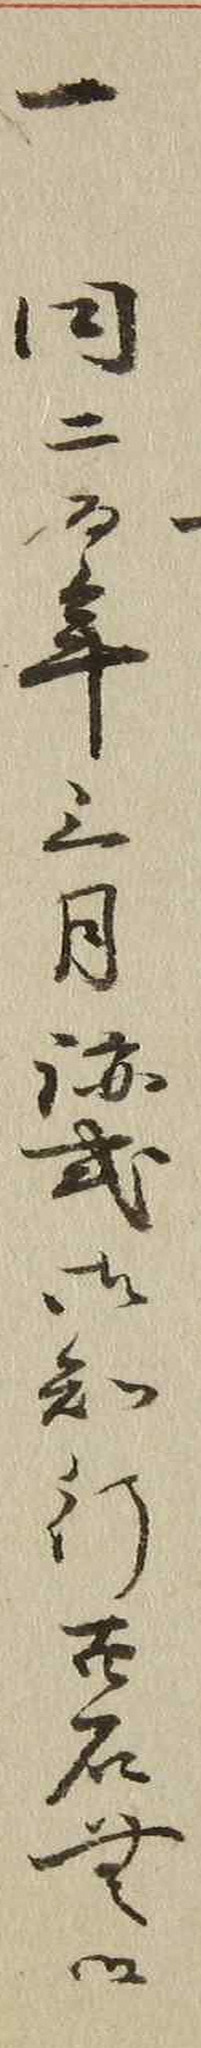一同二酉年三月跡式御知行百石無御
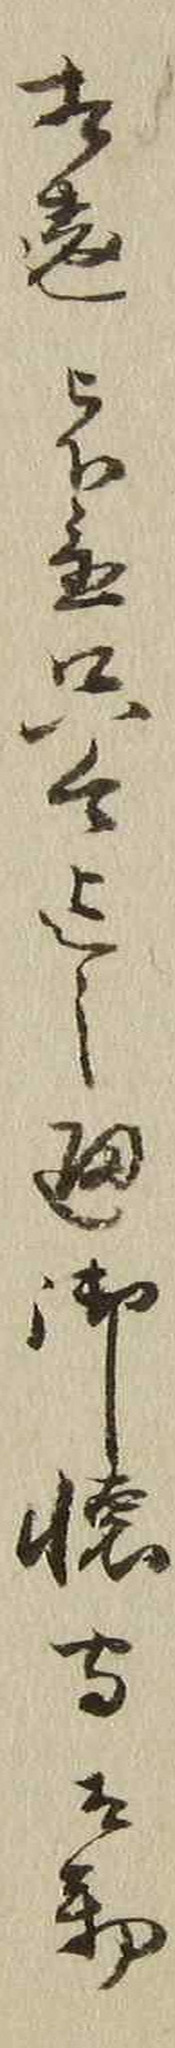相違被下置只今迄之通御懐守相勤
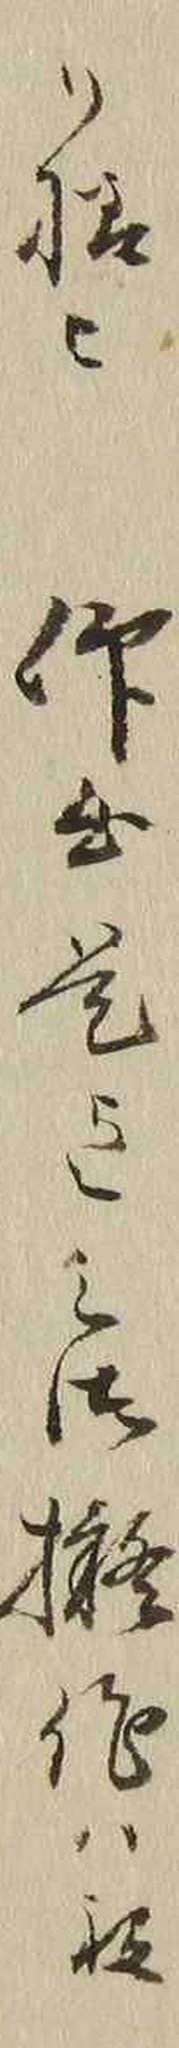候様被仰出是迄之御擬作ハ被
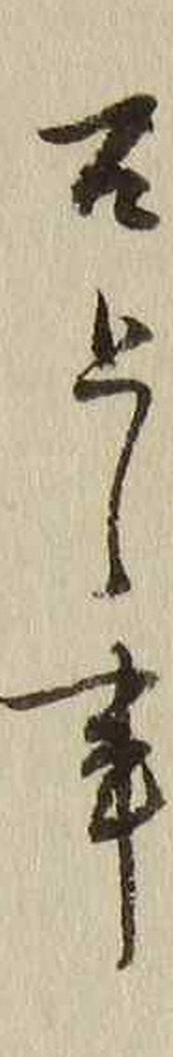召上候事
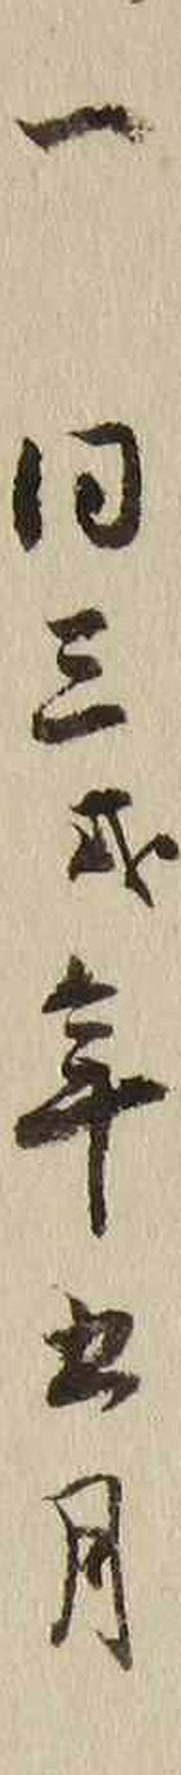一同三戌年五月
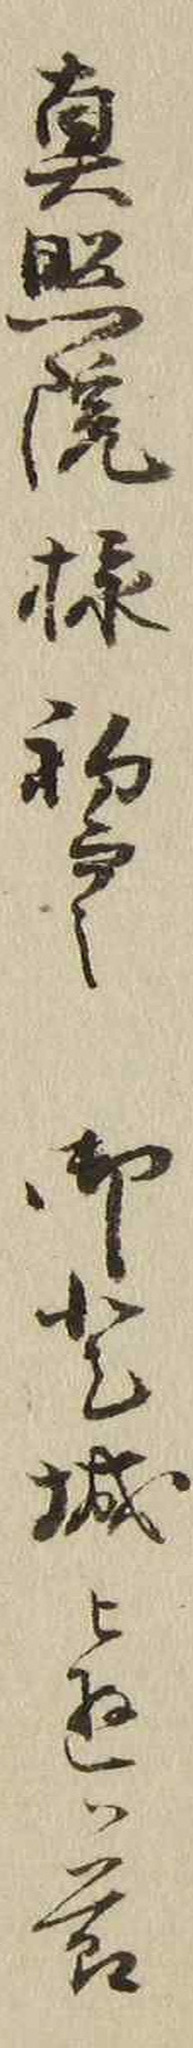真照院様初而之御登城上被遊候節
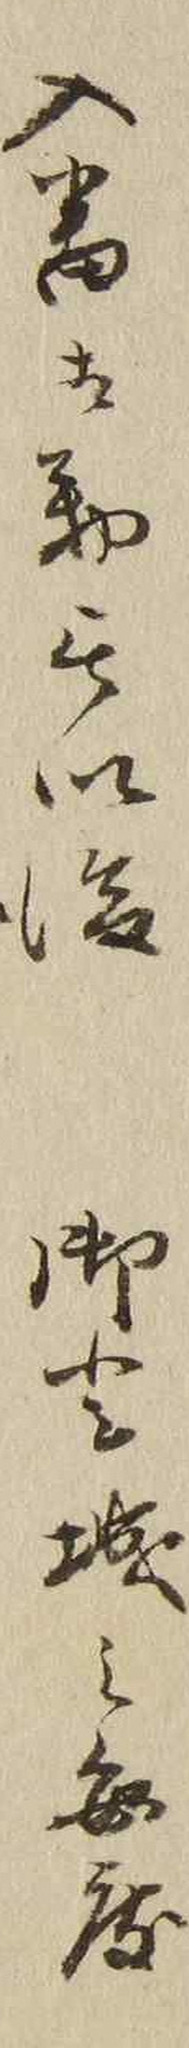入番相勤其以後御登城之毎度

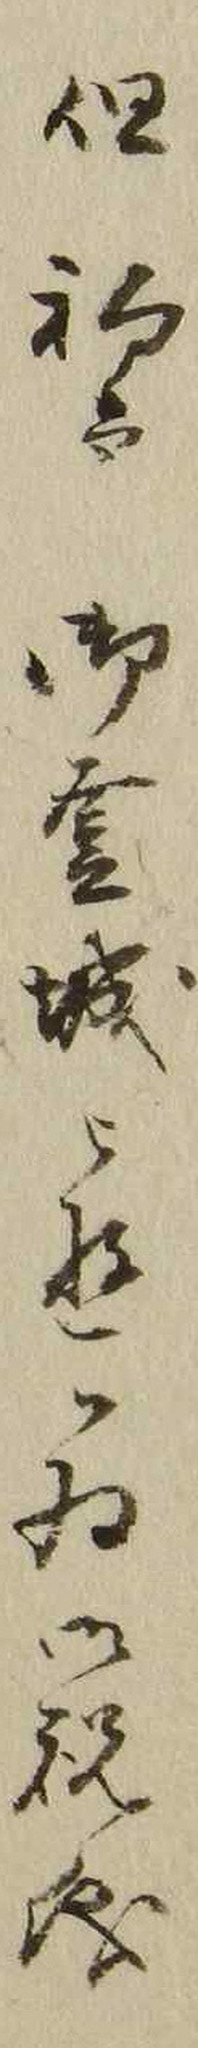但初而御登城被遊候為御祝儀
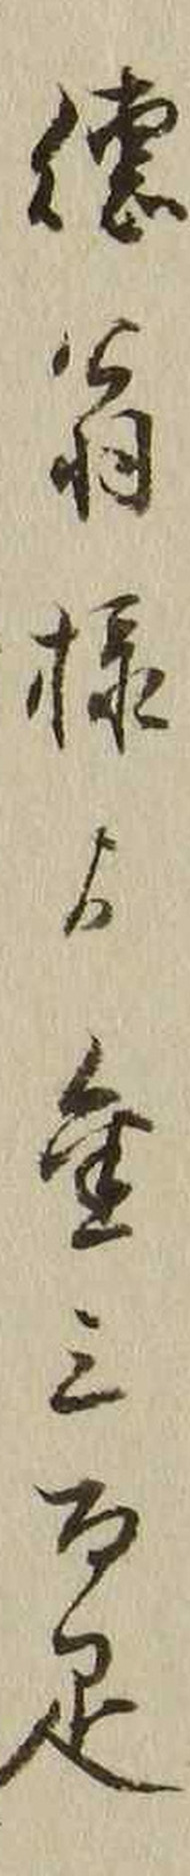徳翁様ゟ金三百疋
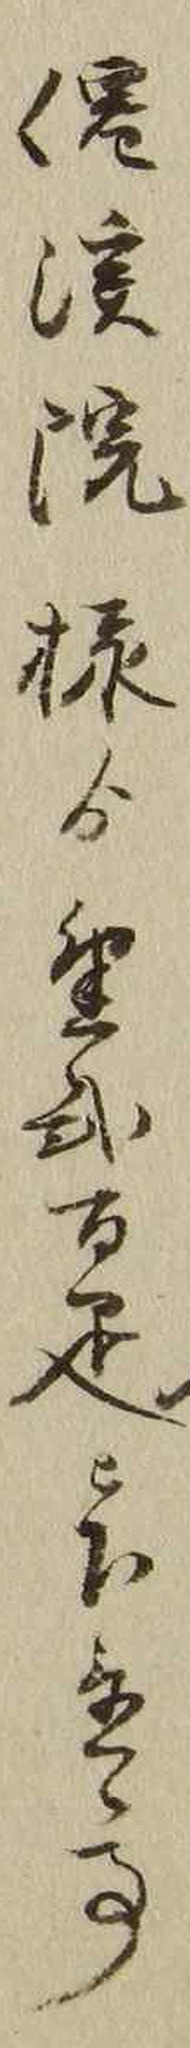仙渓院様ゟ金弐百疋被下置候事
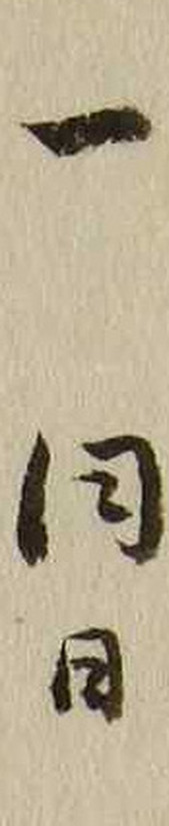一同日
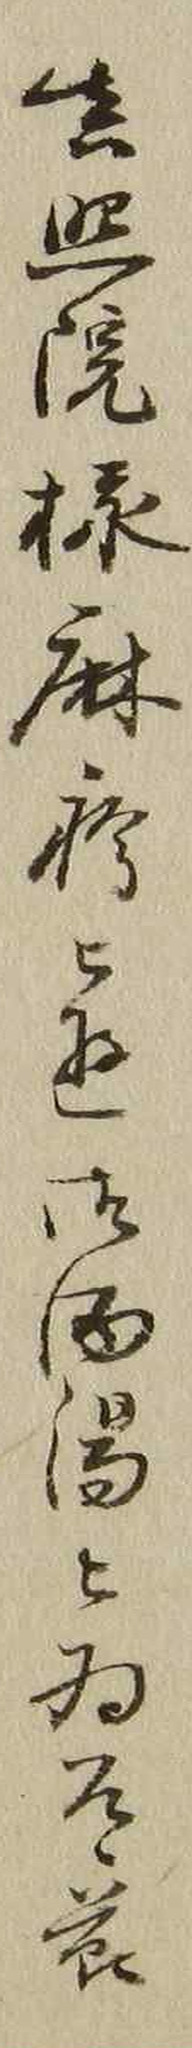真照院様麻疼被遊御酒湯被為召候節
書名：諸士系譜　巻之225　ま之部6
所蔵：会津若松市立会津図書館
